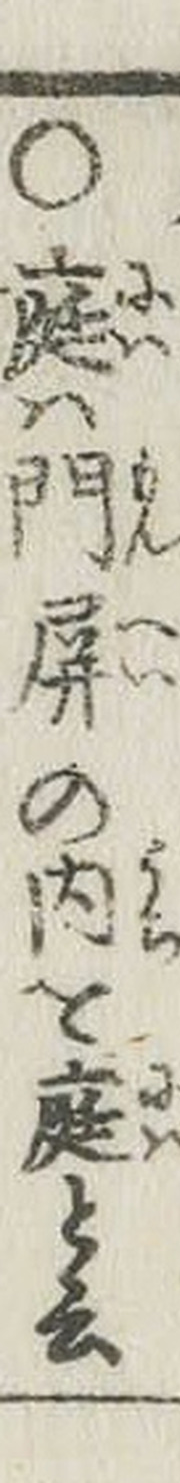○庭は門屏の内を庭と云
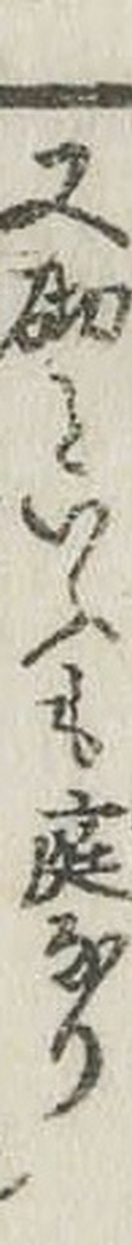又砌といふも庭なり
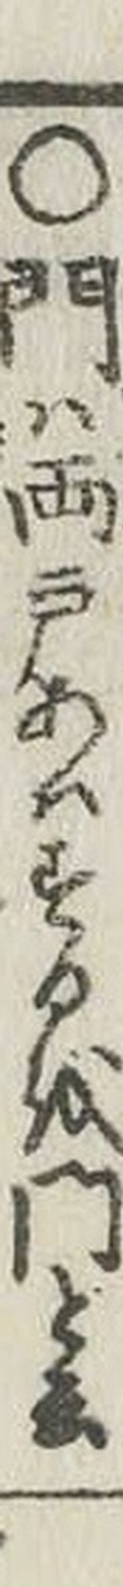○門は両戸あはするを門と云
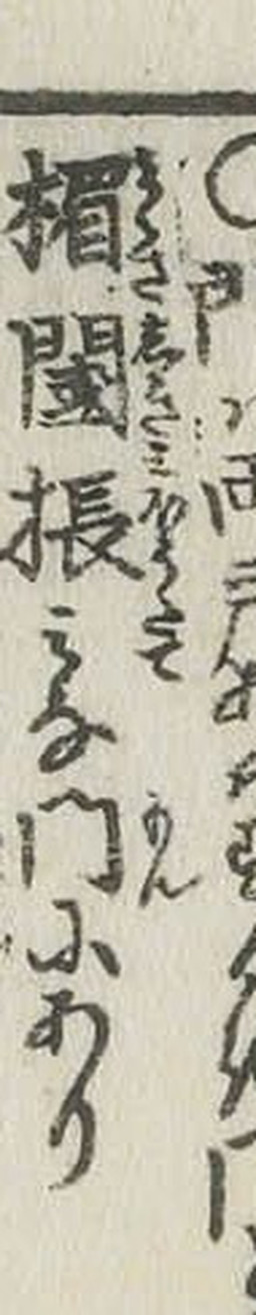楣閾棖みな門にあり
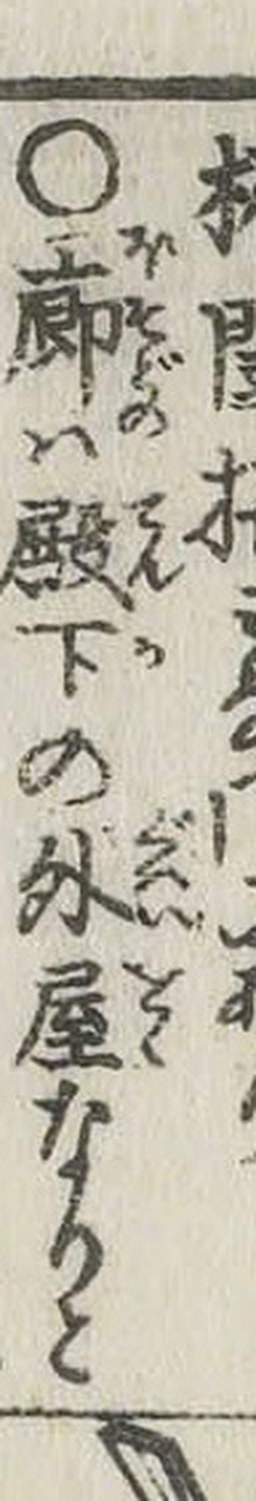○廊は殿下の外屋なりと
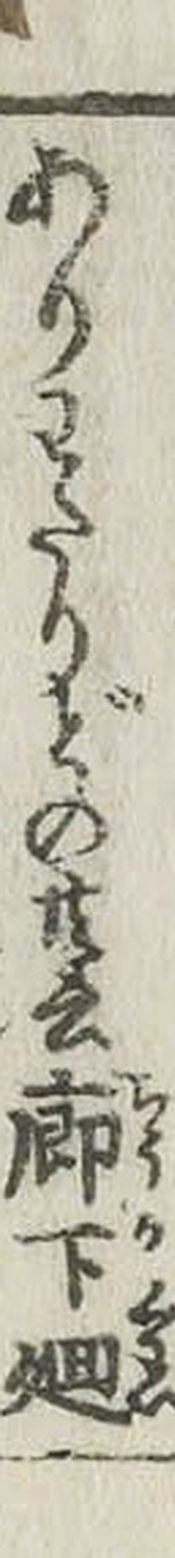ありわたりどの共云廊下廻
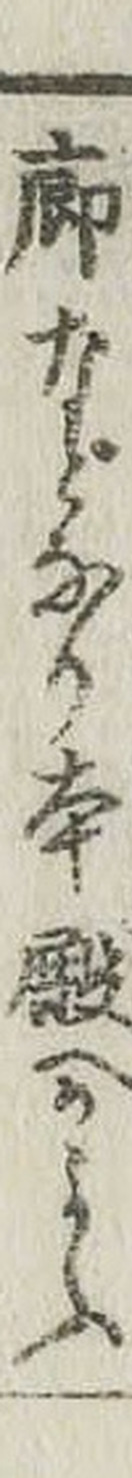廊などなり本殿へかよふ
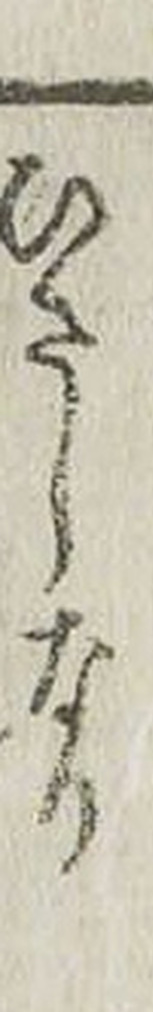ひさしなり
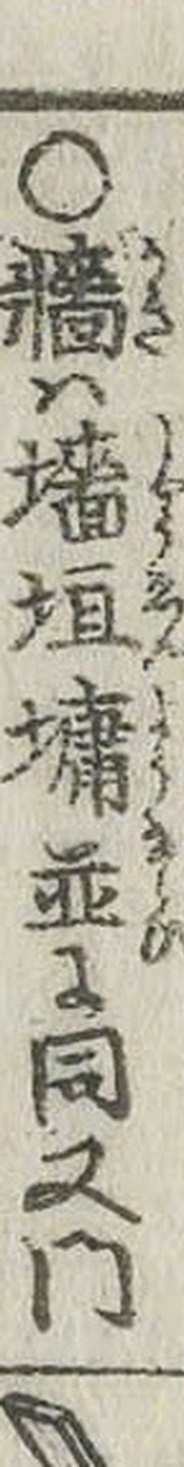○牆は墻垣墉並に同又門
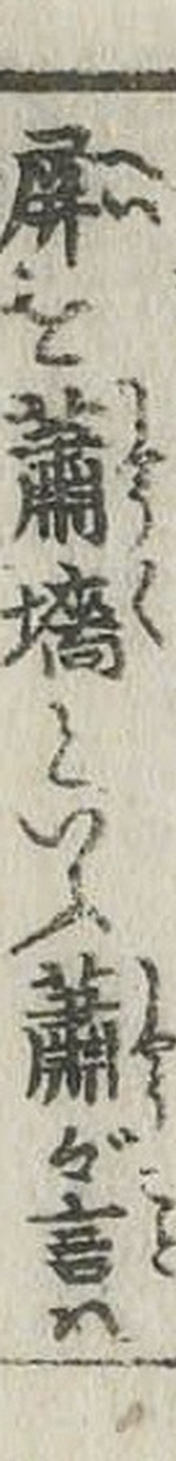屏を蕭墻といふ蕭”々言は
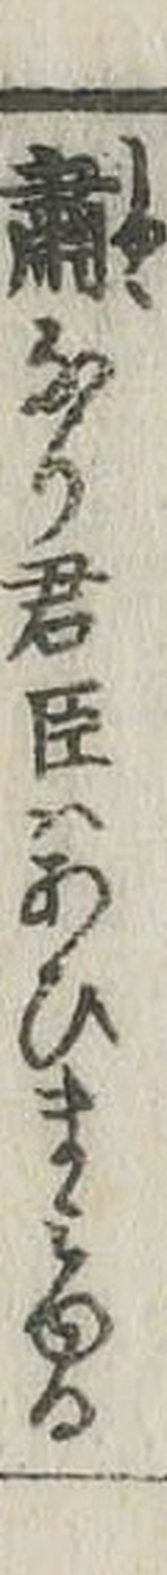肅なり君臣はあひまみゆる

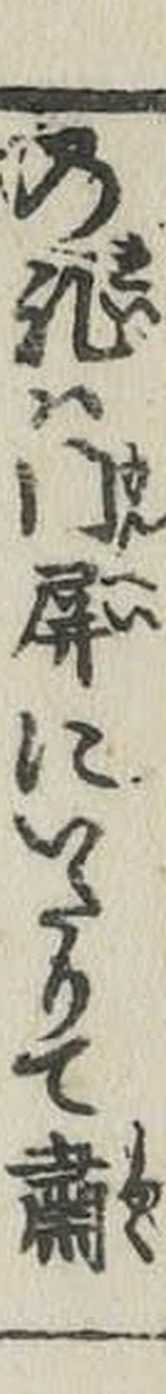の礼は門屏にいたりて肅
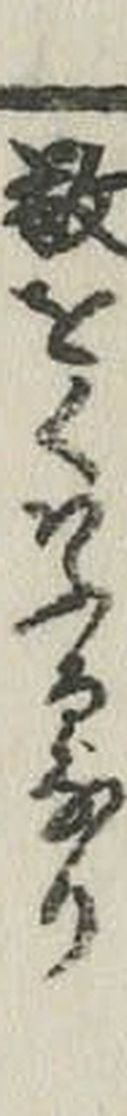敬をくはふるなり
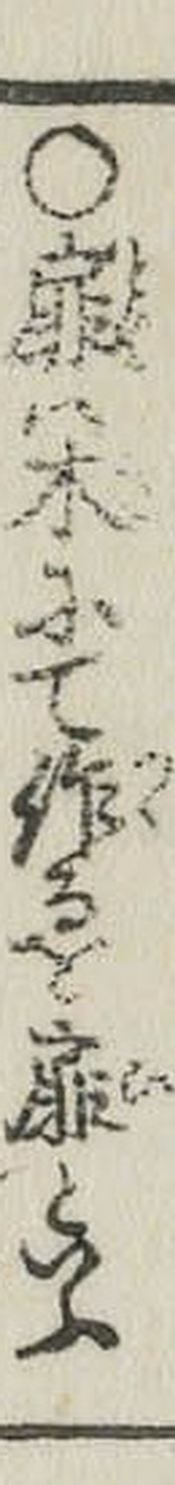○扉は木にて作るを扉といふ
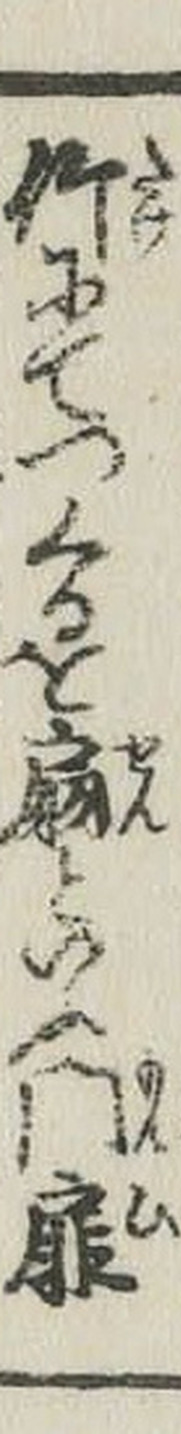竹にてつくるを扇といふ門扉
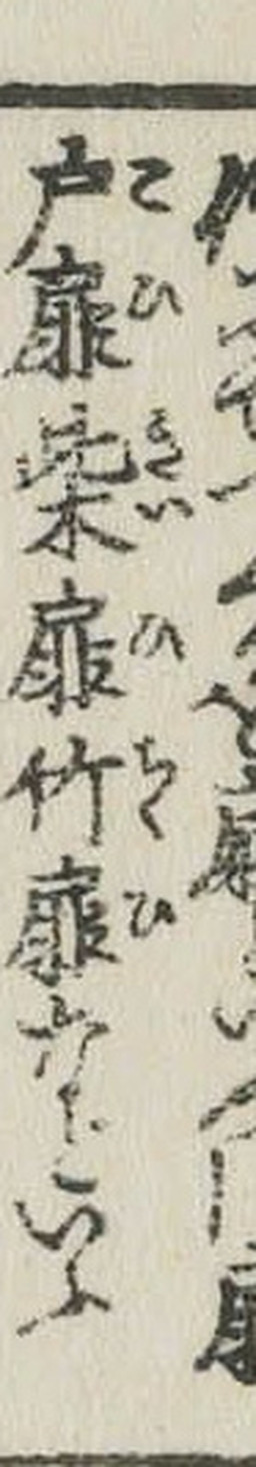戸扉柴扉竹扉などいふ
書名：増補頭書訓蒙図彙大成 10巻 2:巻之1-3
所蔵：東京学芸大学教育コンテンツアーカイブ
